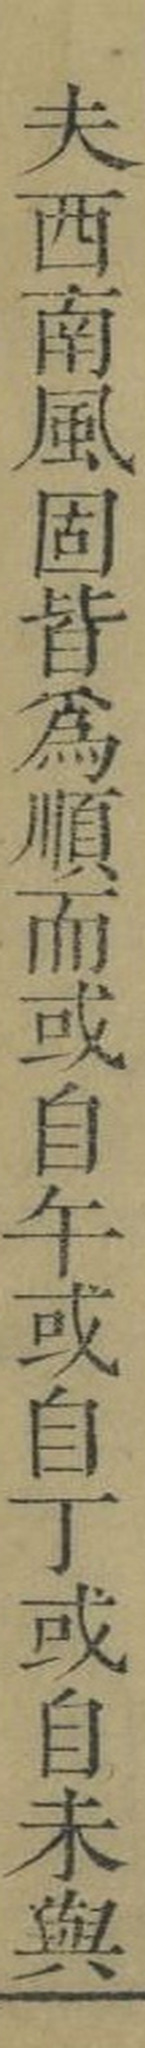夫西南風固皆爲順而或自午或自丁或自未與

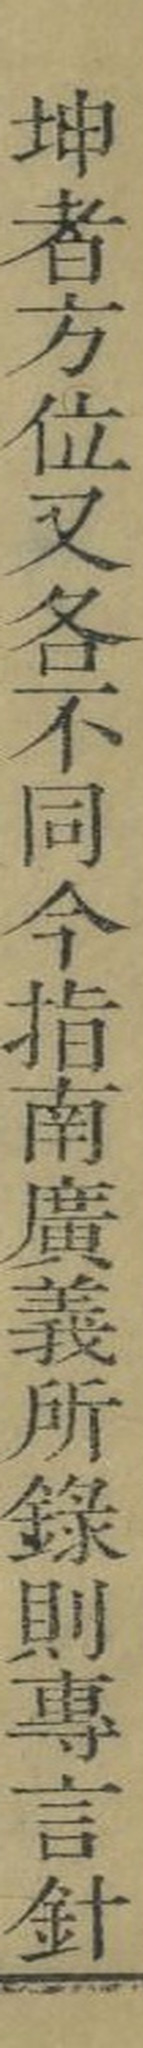坤者方位又各不同今指南廣義所錄則專言針
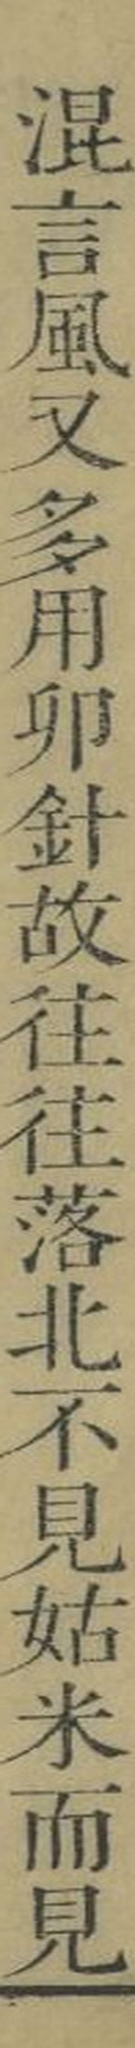混言風又多用卯針故往往落北不見姑米而見
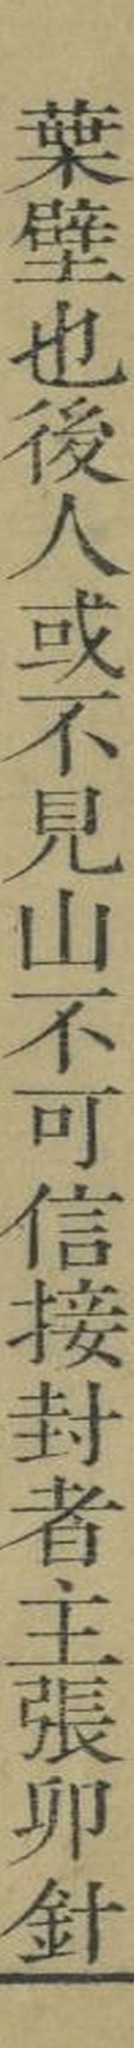葉壁也後人或不見山不可信接封者主張卯針
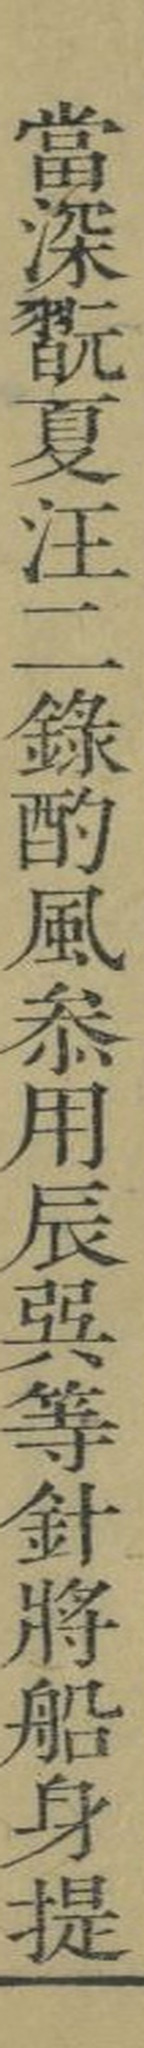當深翫夏汪二錄酌風叅用辰㢲等針將船身提
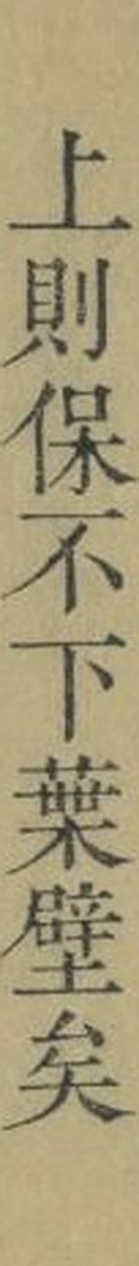上則保不下葉壁矣
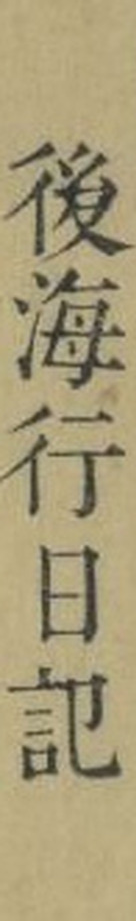後海行日記
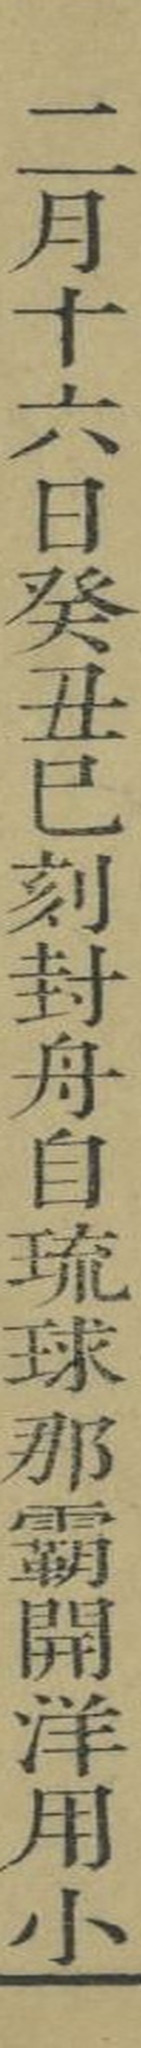二月十六日癸丑巳刻封舟自琉球那霸開洋用小
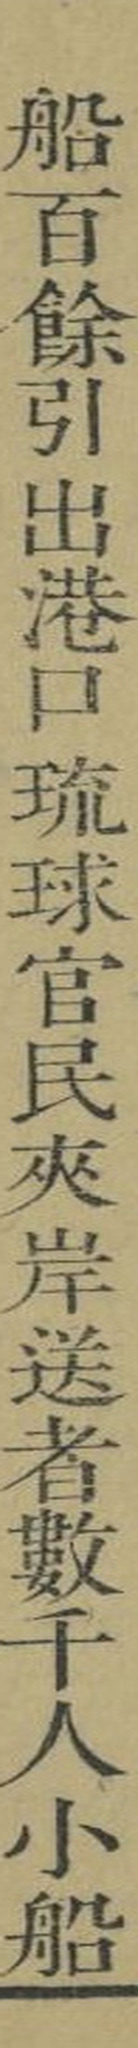船百餘引出港口琉球官民夾岸送者數千人小船
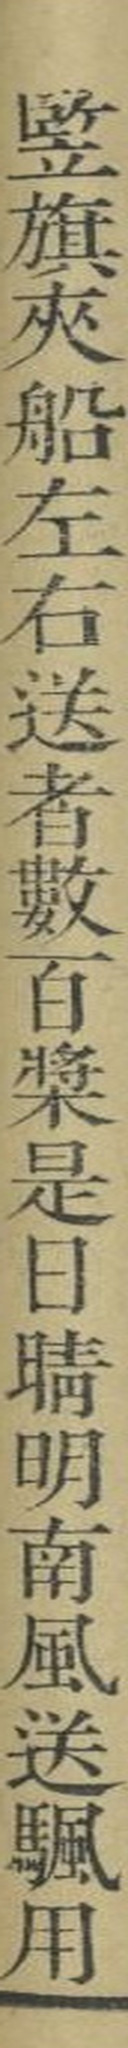堅旗夾船左右送者數百槳是日晴明南風送颿用
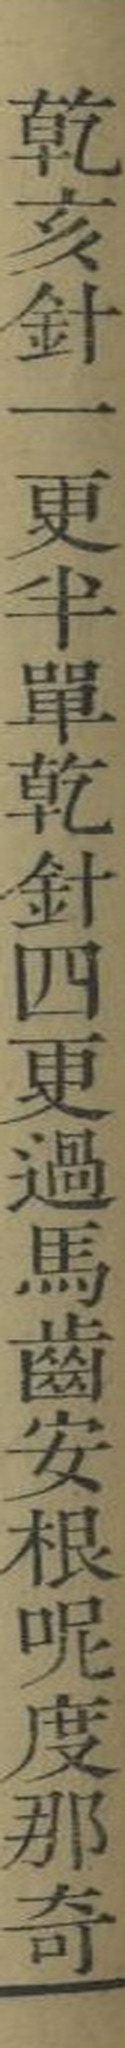乾亥針一更半單乾針四更過馬齒安根呢度那奇
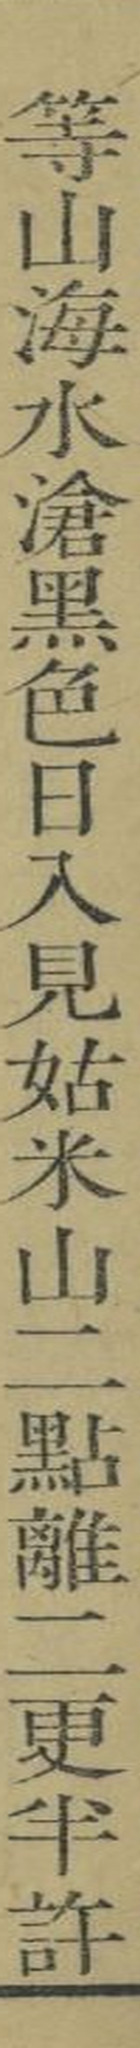等山海水滄黑色日入見姑米山二點離二更半許
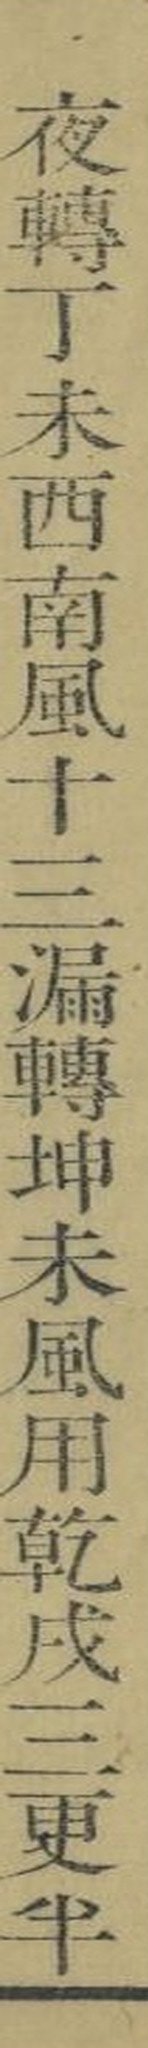夜轉丁未西南風十三漏轉坤未風用乾戌三更半
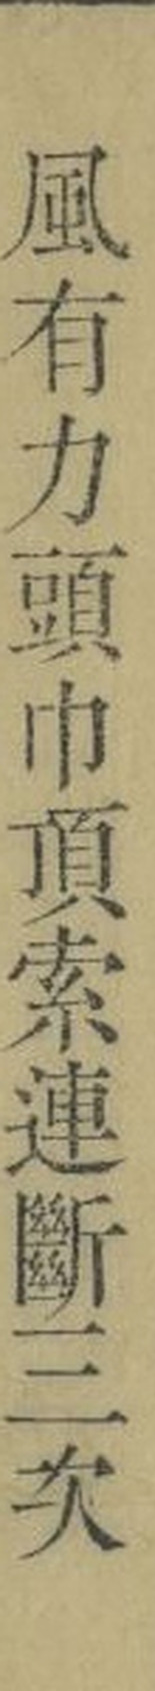風有力頭巾頂索連斷三次
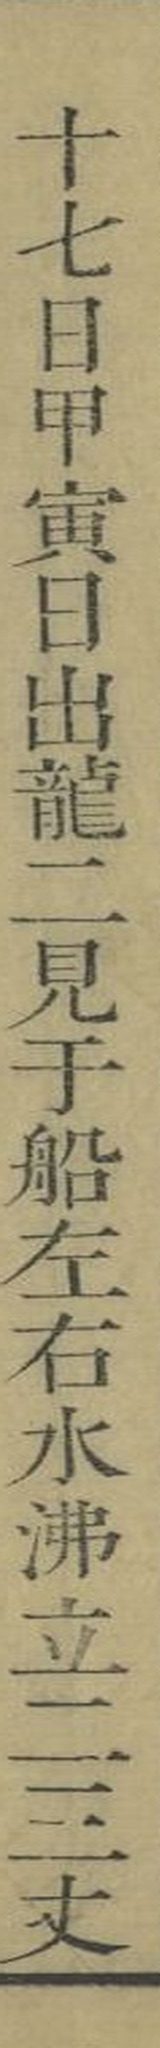十七日甲寅日出龍二見于船左右水沸立二三丈
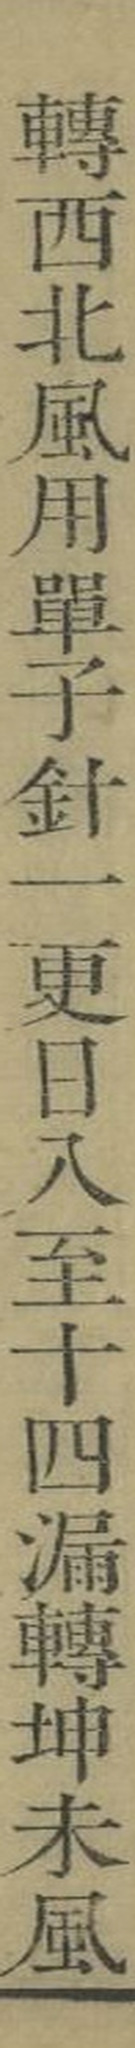轉西北風用單子針一更日入至十四漏轉坤未風
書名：中山伝信録 巻一
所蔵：University of the Ryukyus Library
